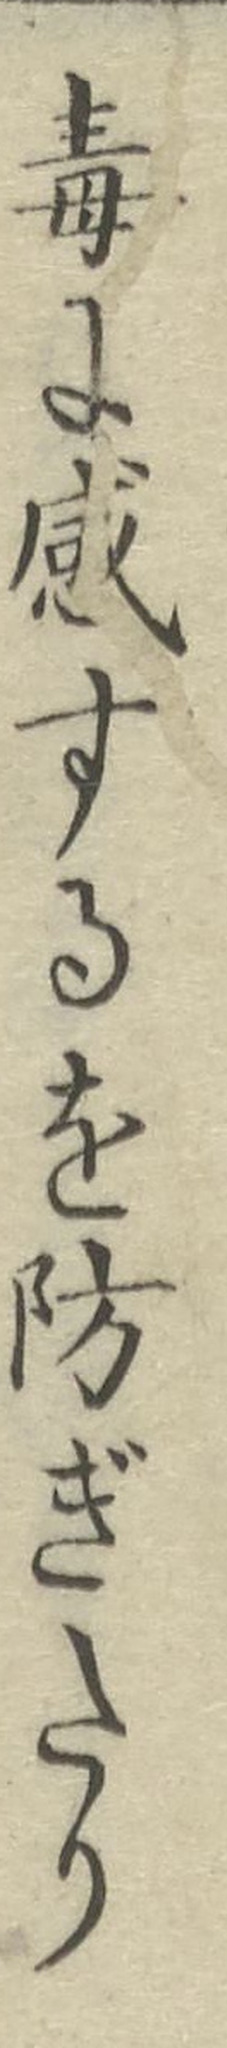毒に感するを防ぎたり
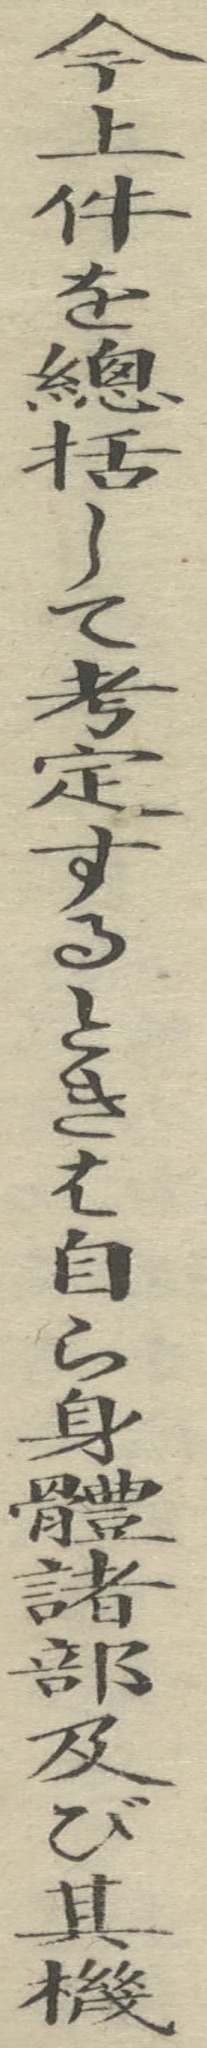今上件を總括して孝定するときは自ら身體諸部及び其機
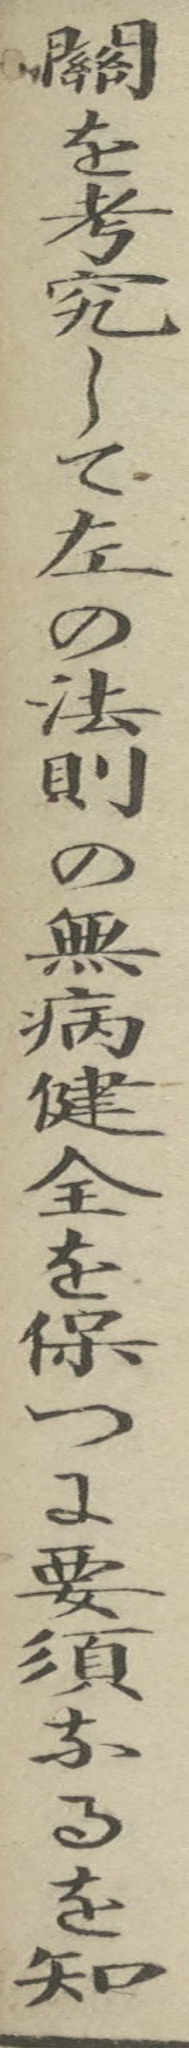關を考究して左の法則の無病健全を保つに要須なるを知
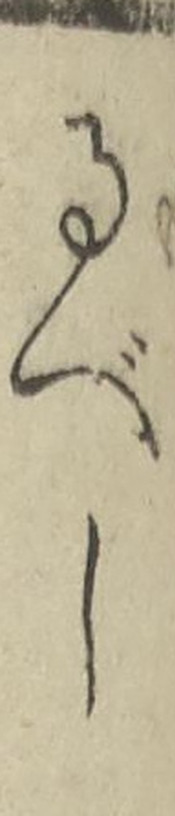るべし
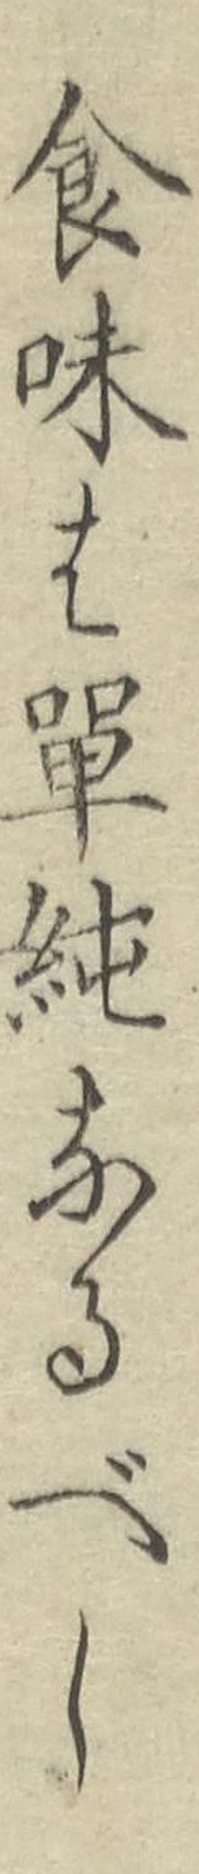食味は單純なるべし
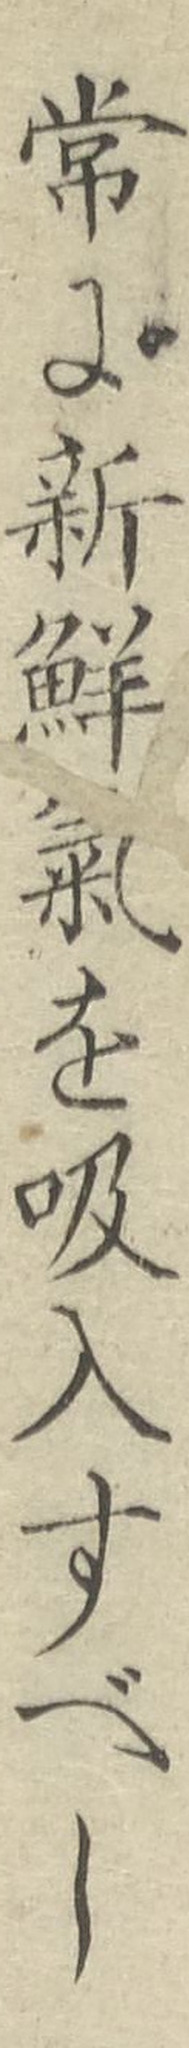常に新鮮氣を吸入すべし
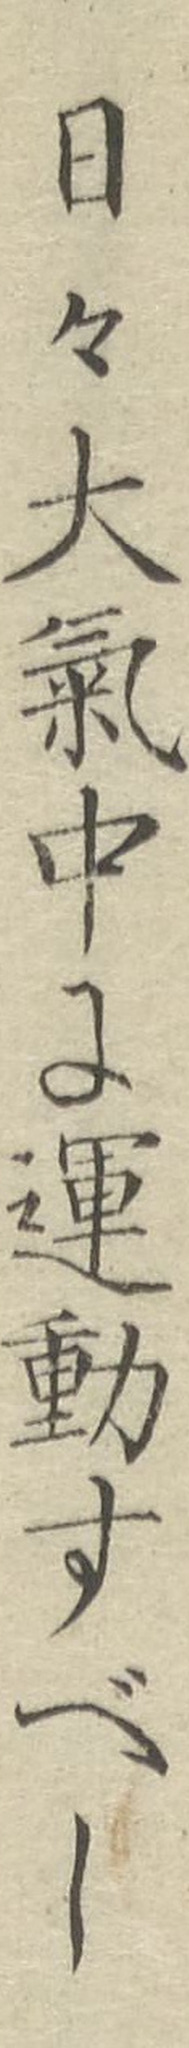日々大氣中に運動すべし
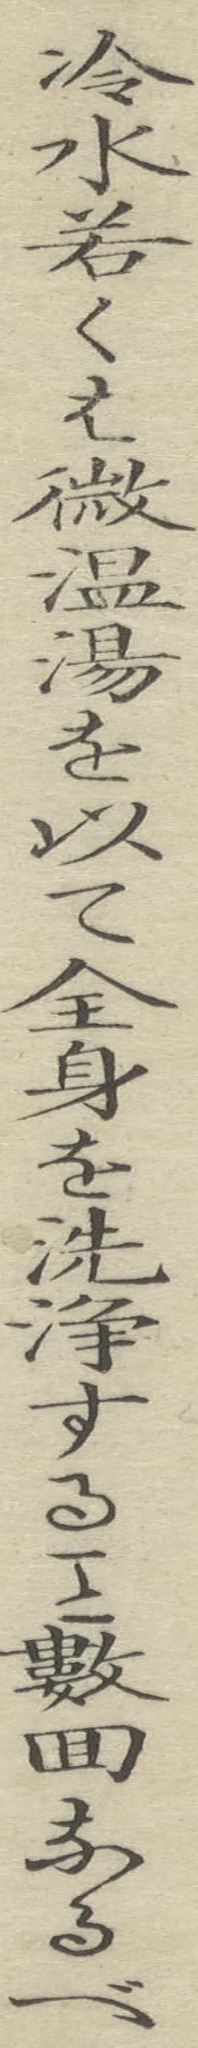冷水若くは微温湯を以て全身を洗浄すること數回なるべ
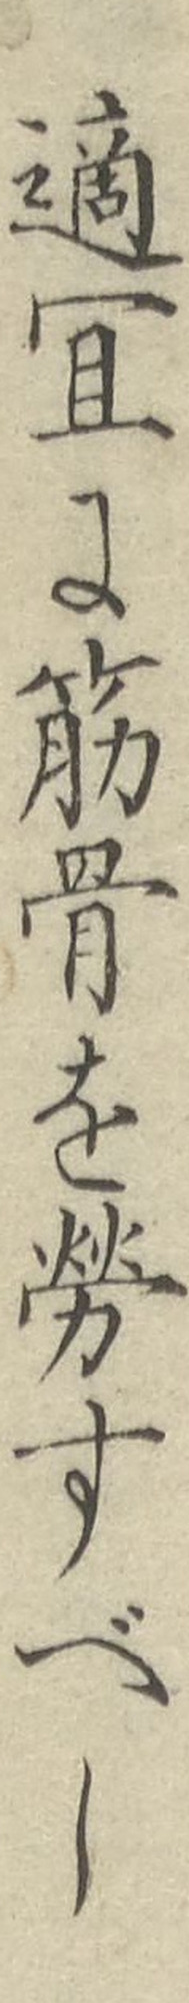適宜に筋骨を労すべし
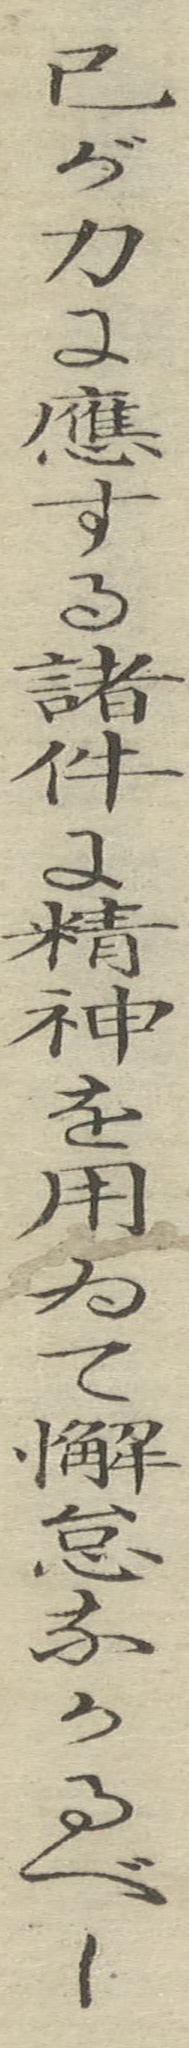己が力に應する諸件に精神を用ゐて懈怠なかるべし
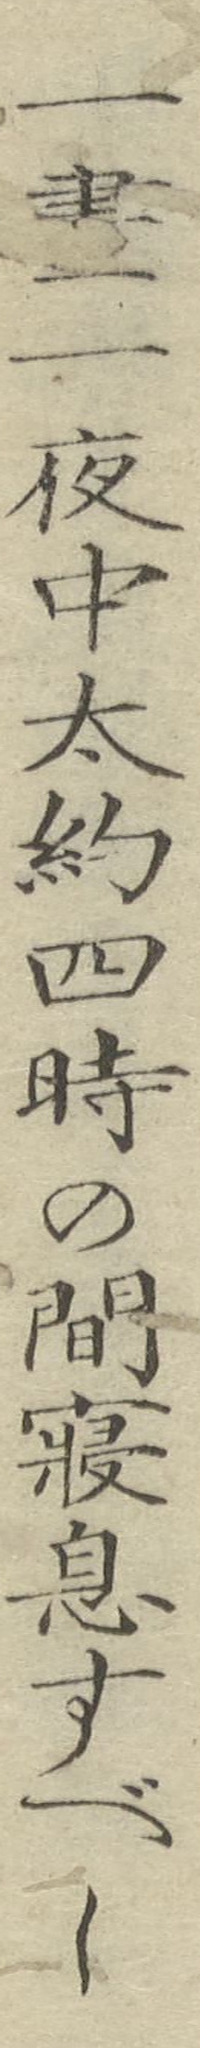一晝一夜中太約四時の間寝息すべし

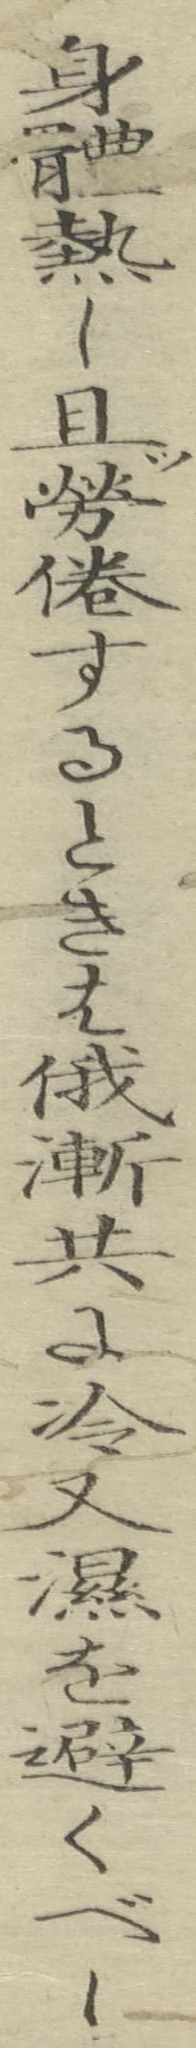身體熱し且労倦するときは俄漸共に冷又濕を避くべし
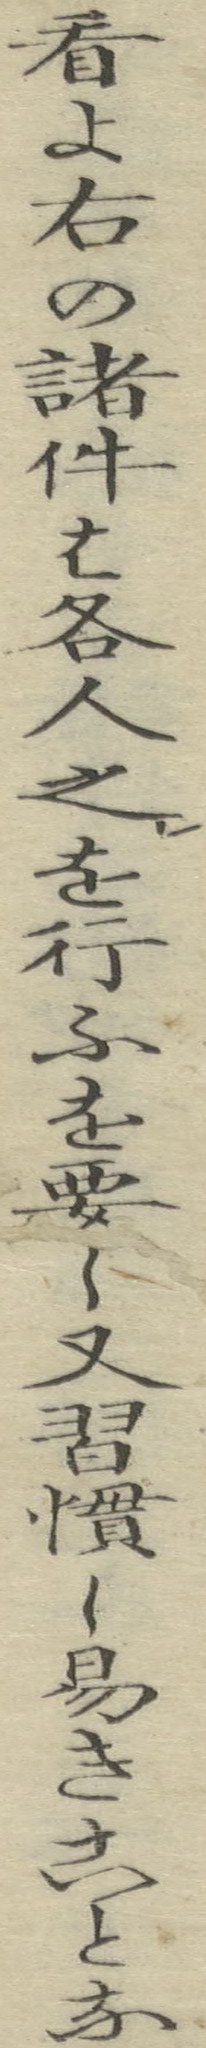看に右の所件は各人之行ふを要し又習慣し易きことな
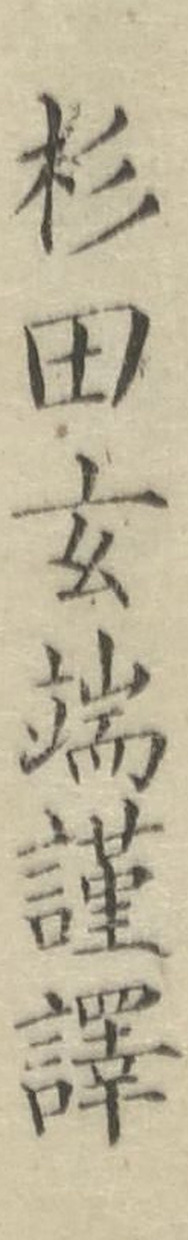杉田玄端謹譯
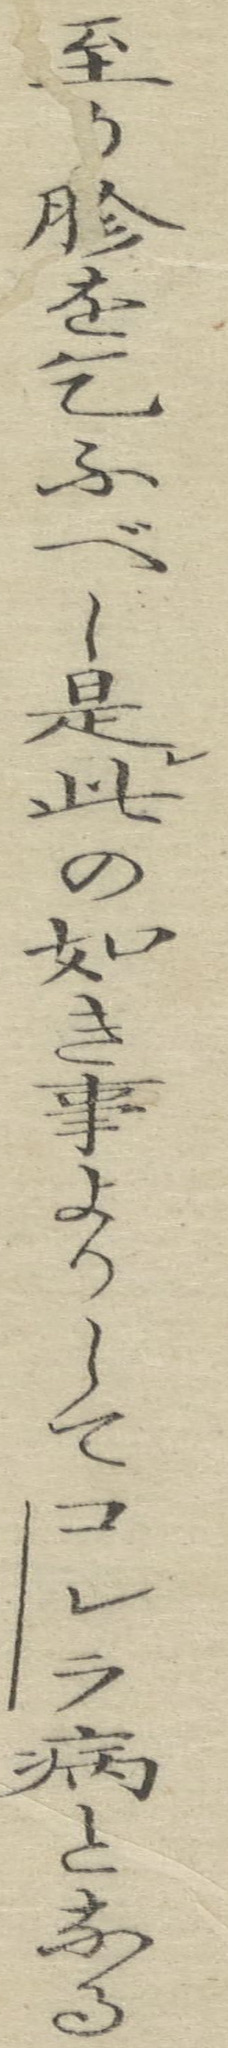至り胗を乞ふべし是此の如き事よりしてコレラ病となる
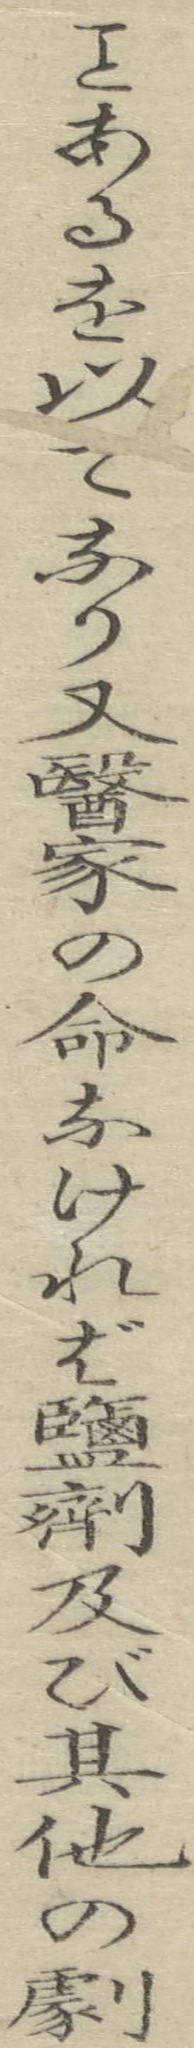ことあるを以てなり又醫家の命なければ䀋劑及び其他の劇
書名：官版疫毒預防説　全
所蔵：東京大学総合図書館 General Library in the University of Tokyo, JAPAN
